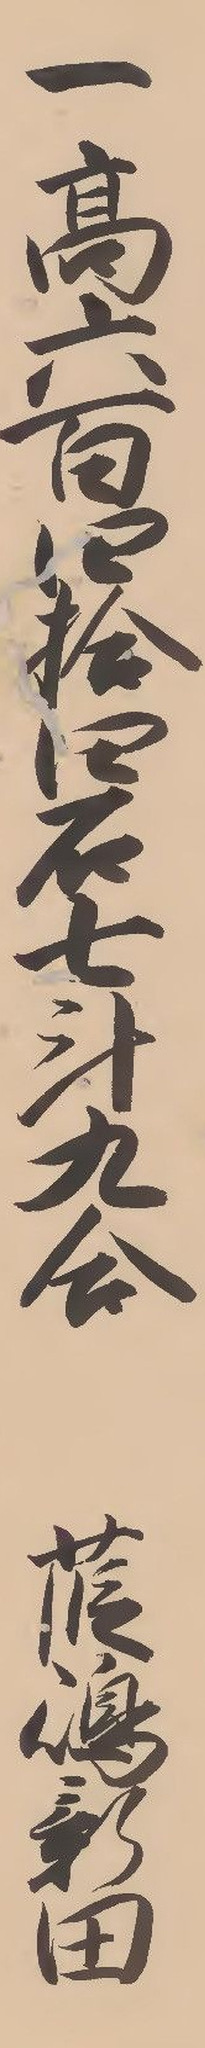一高六百四拾四石七斗九合葭嶋新田
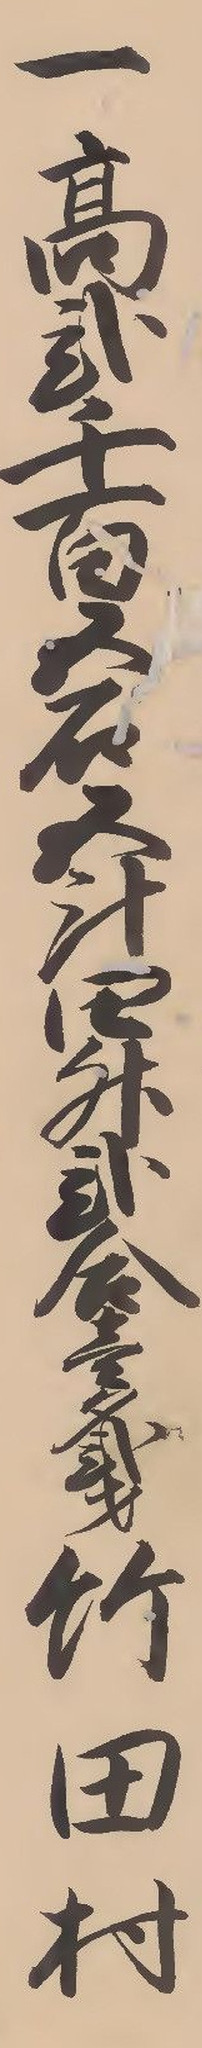一高弐千百五石五斗四升弐合壱勺弐才竹田村
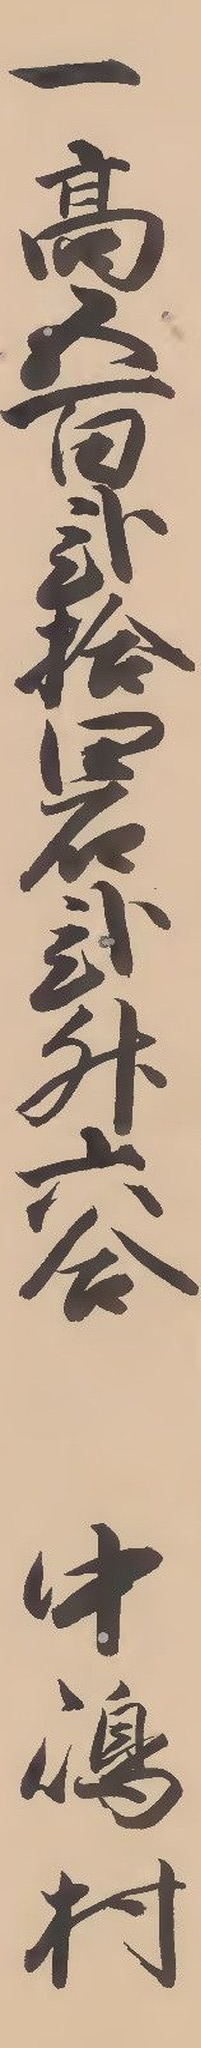一高五百弐拾四石弐升六合中嶋村
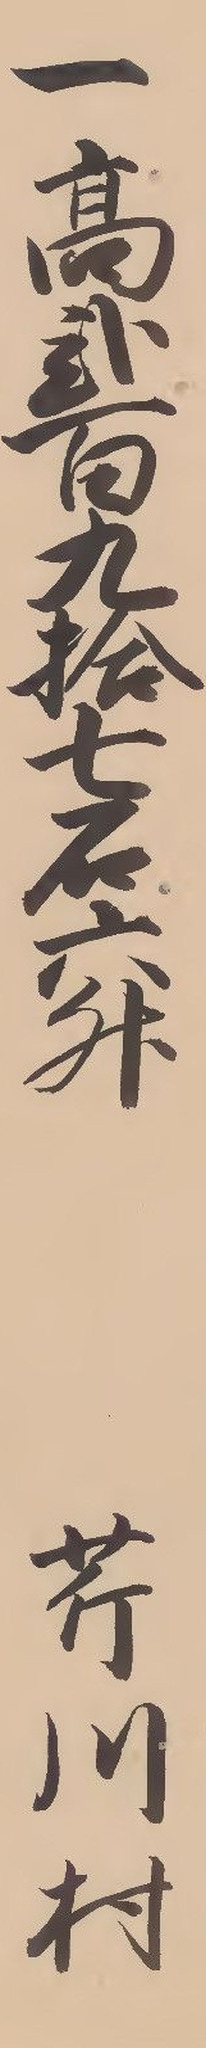一高弐百九拾七石六升芹川村
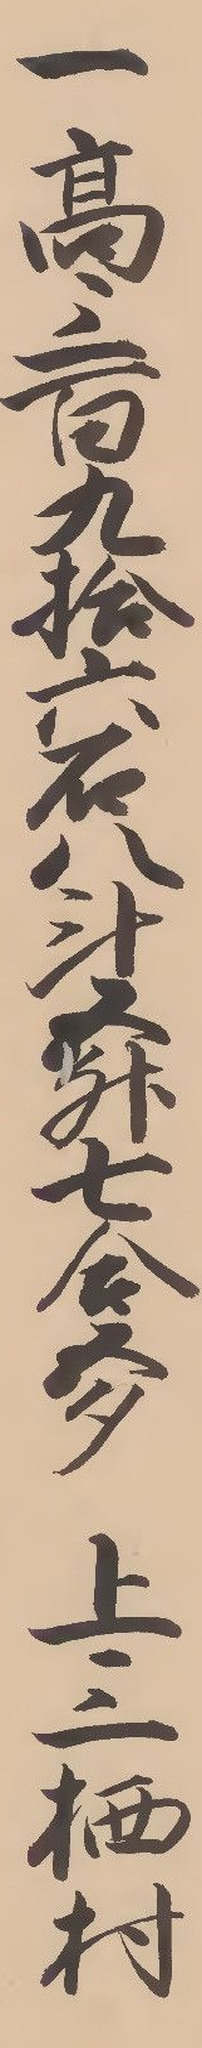一高三百九拾六石八斗五升七合五勺上三栖村

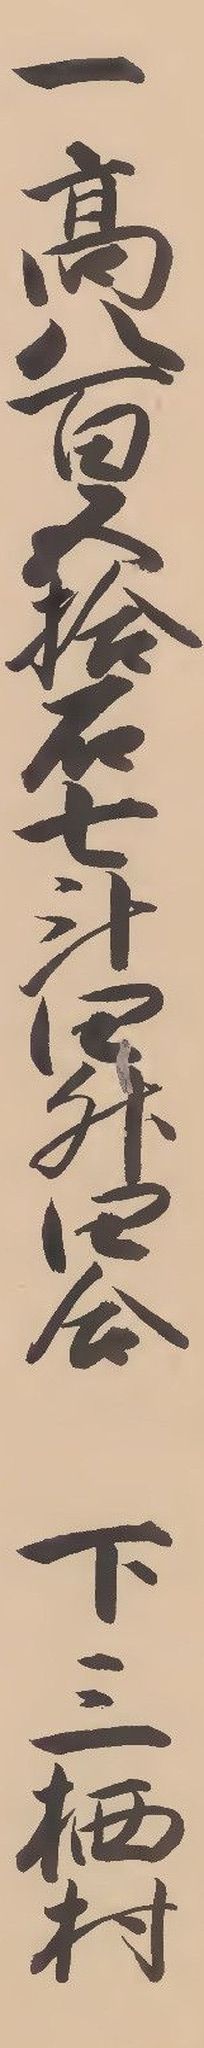一高八百五拾石七斗四升四合下三栖村
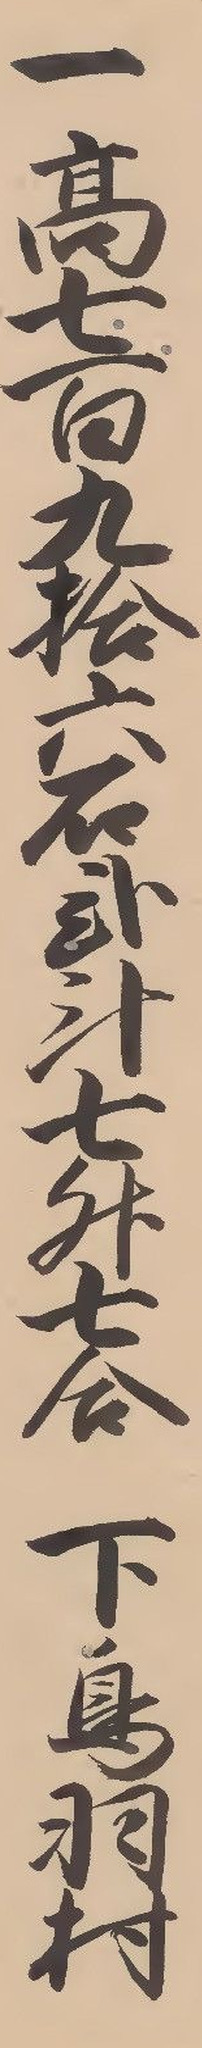一高七百九拾六石弐斗七升七合下鳥羽村
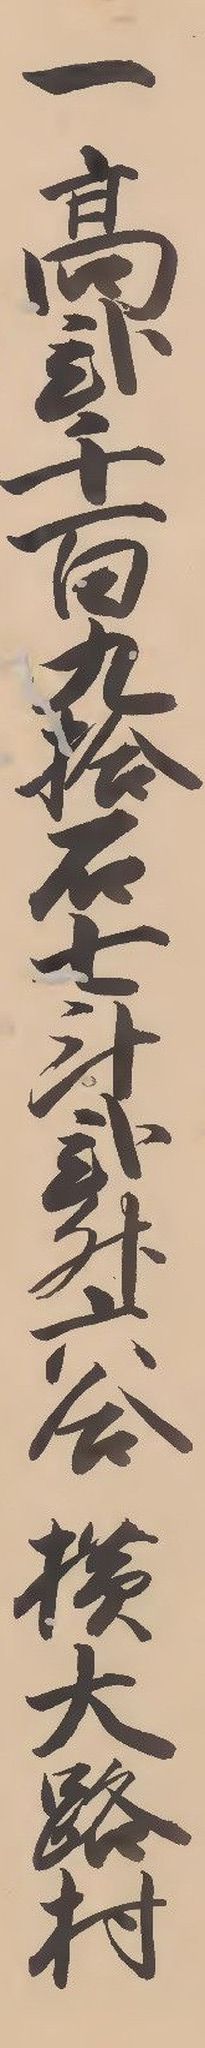一高弐千百九拾石七斗弐升六合横大路村
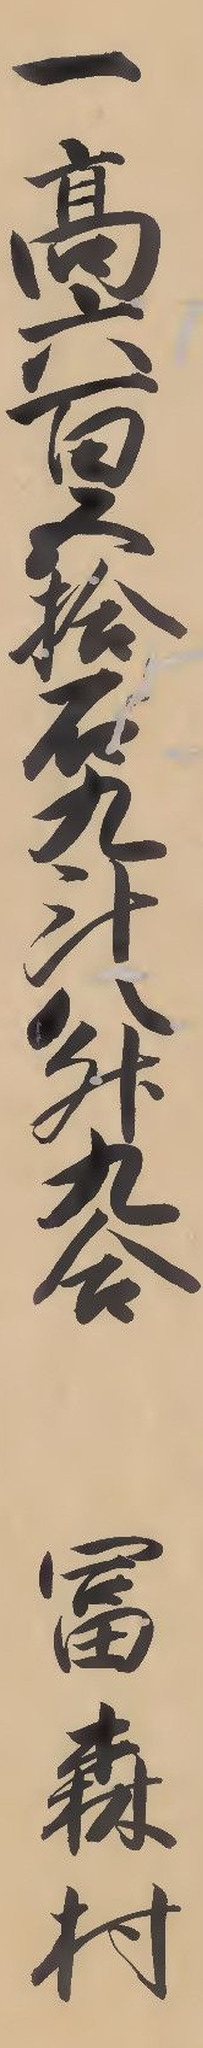一高六百五拾石九斗八升九合富森村
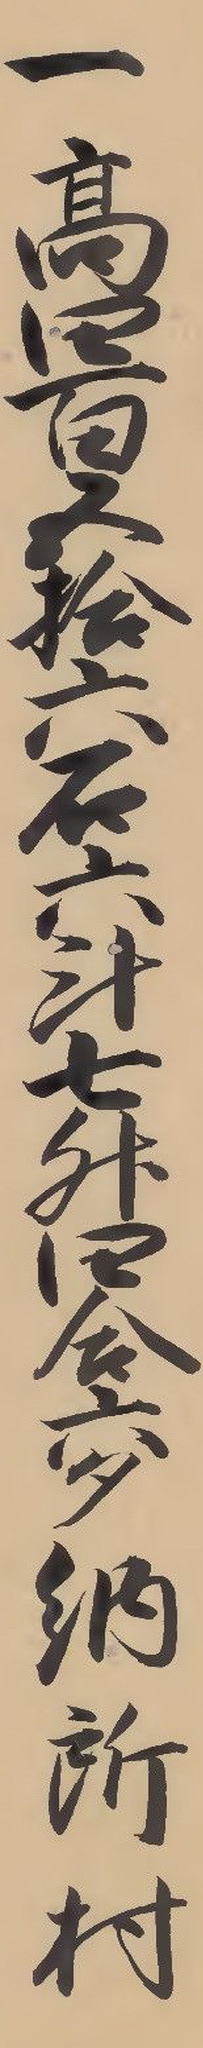一高四百五拾六石六斗七升四合六勺納所村
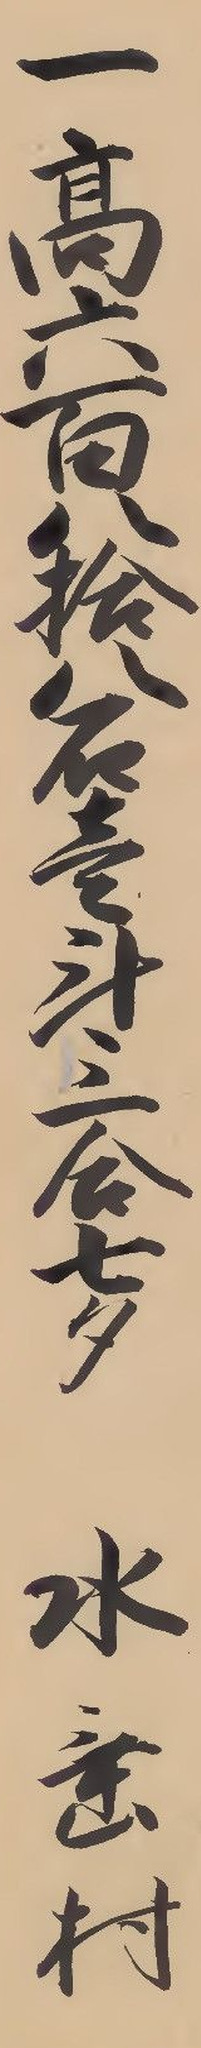一高六百八拾八石壱斗三合七勺水垂村

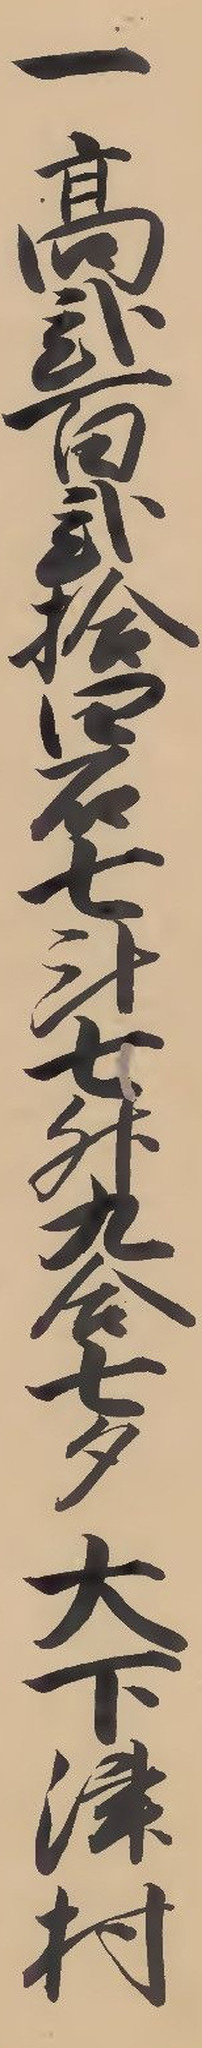一高弐百弐拾四石七斗七升九合七勺大下津村
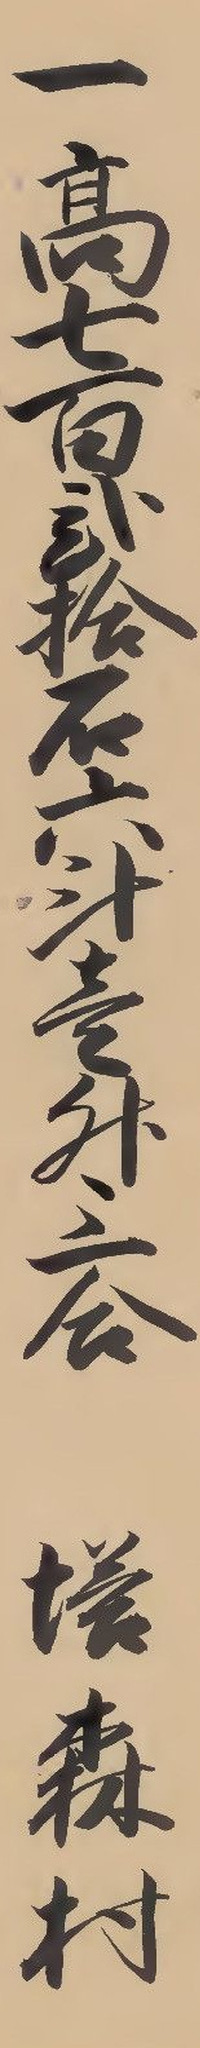一高七百弐拾石六斗壱升三合塔森村
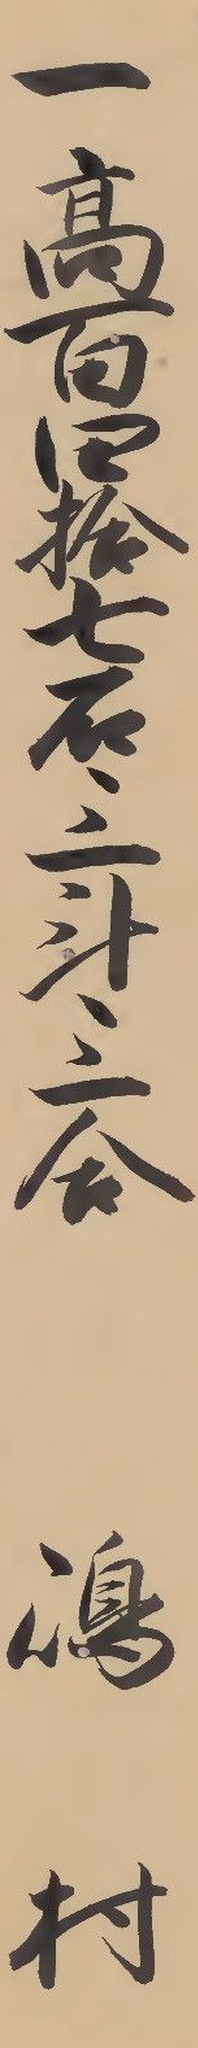一高百四拾七石三斗三合嶋村
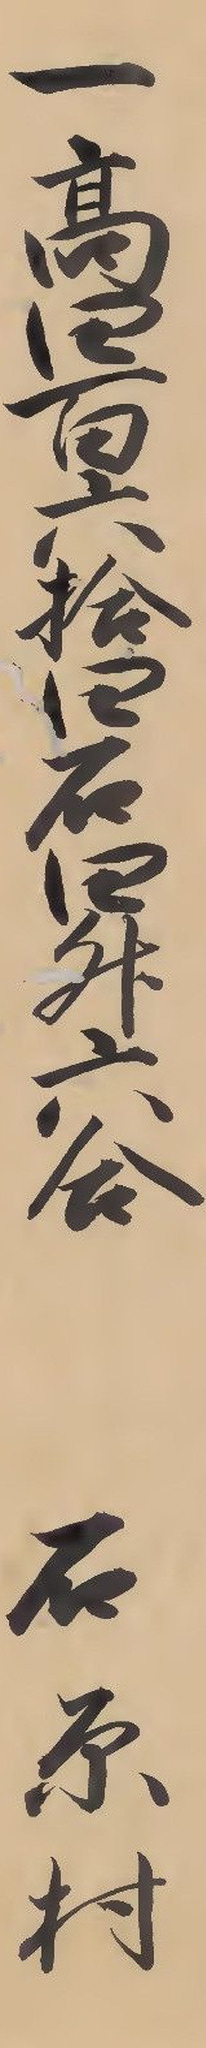一高四百六拾四石四升六合石原村
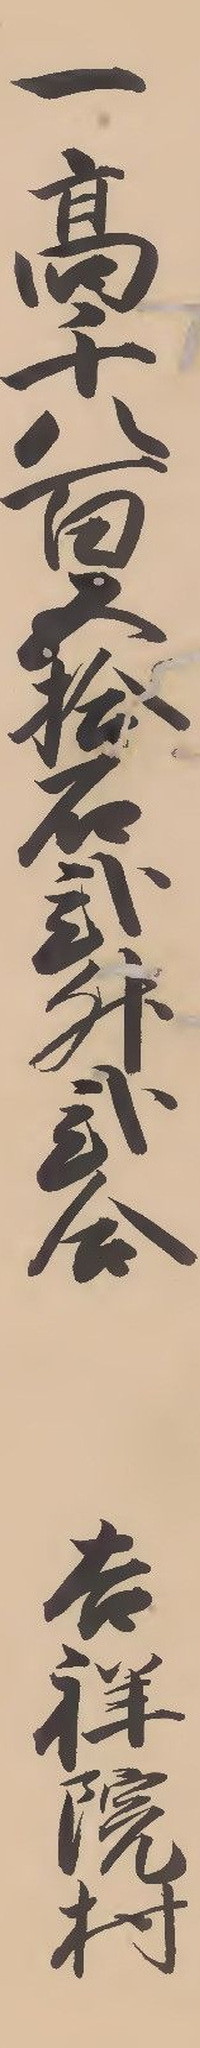一高千八百五拾石弐升弐合吉祥院村
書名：山城国郷帳
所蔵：国立公文書館 National Archives of Japan
